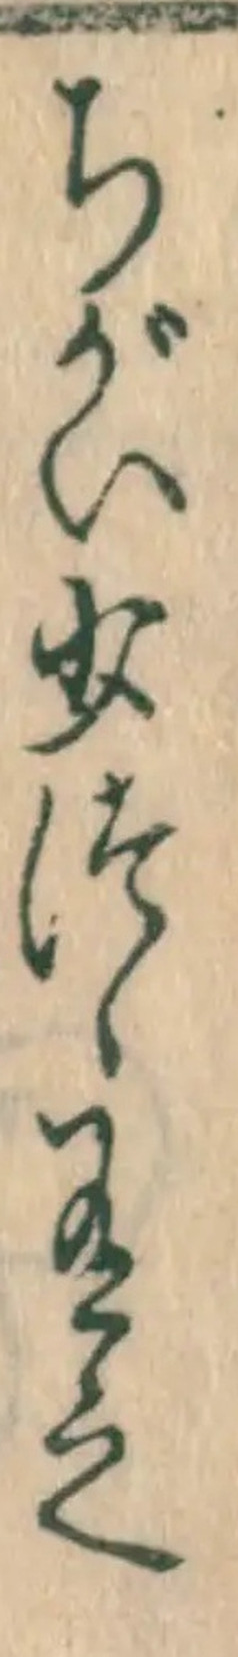ちがい少つゝ有也
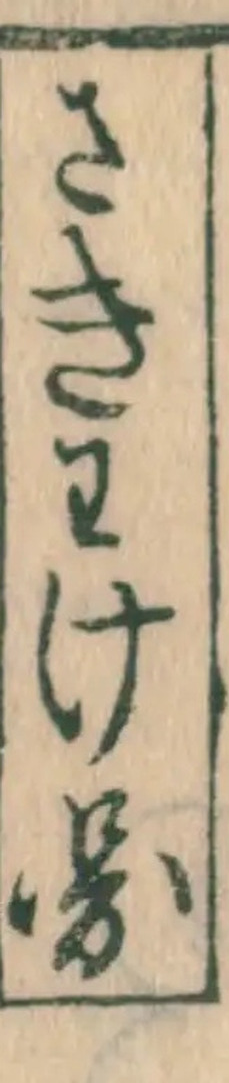さきわけ図
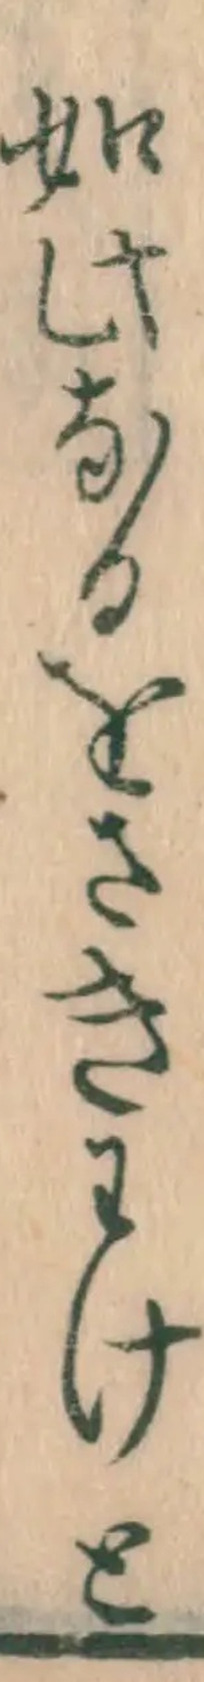如此なるをさきわけと
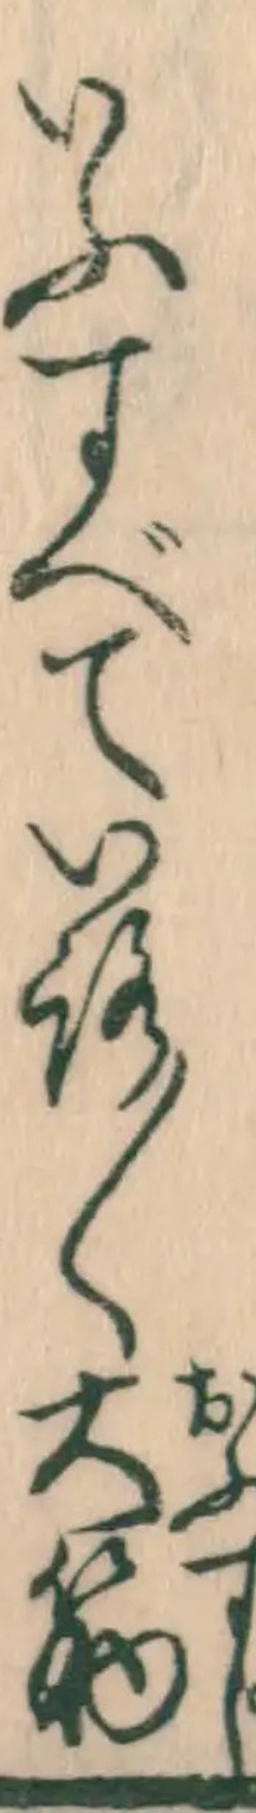いふすべていろ〳〵大筋
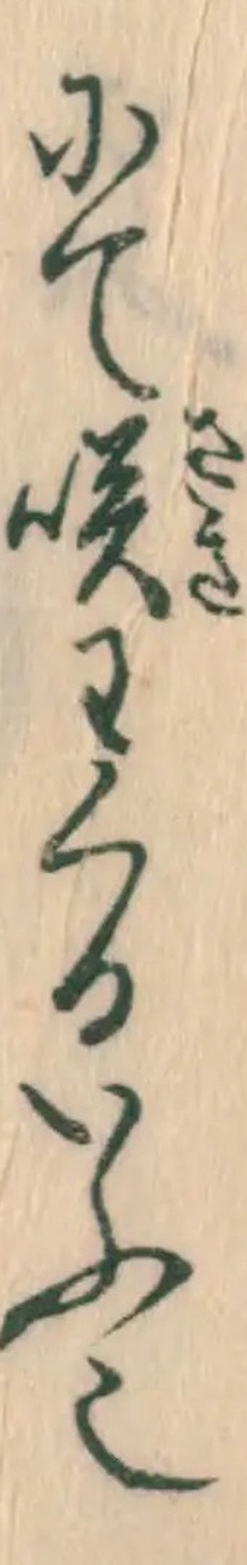にて咲わくるいふ也
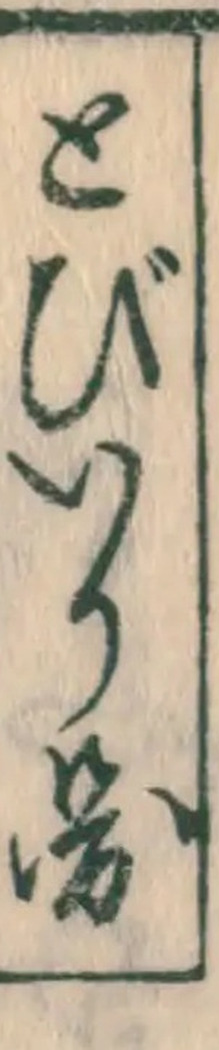とびいり図
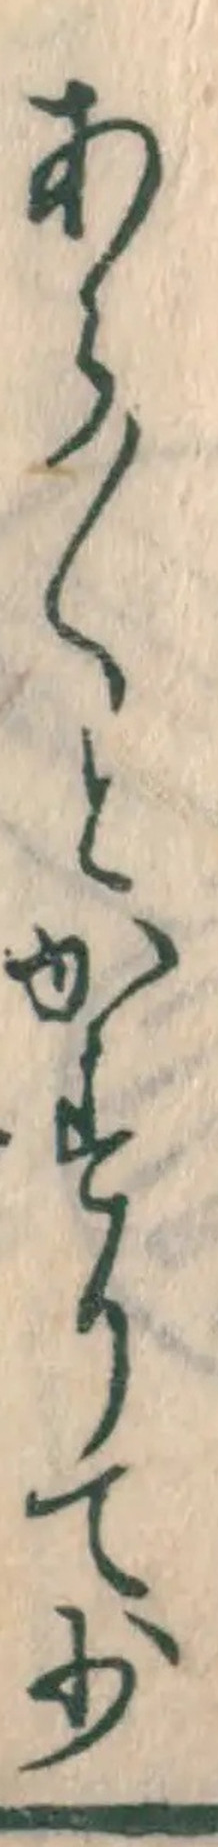あら〳〵とかすりて少
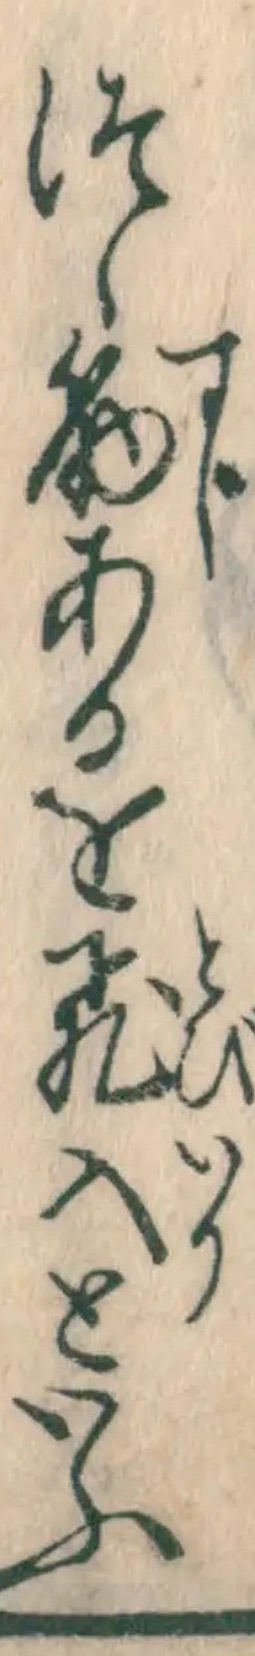つゝ筋あるを飛入といふ

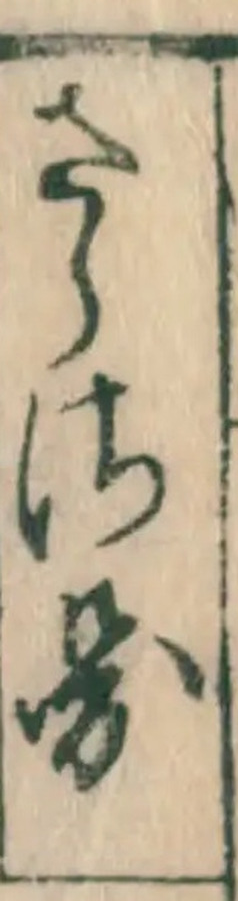さらさ図
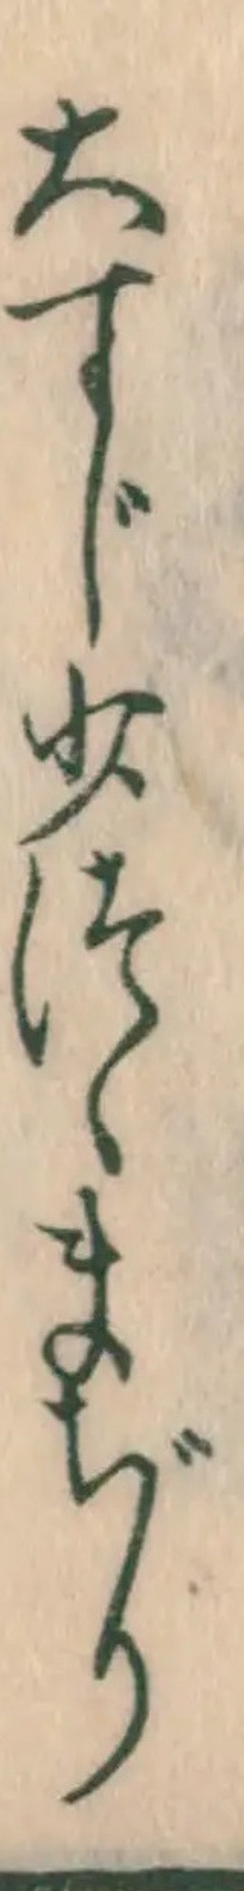大すじ少つゝまぢり
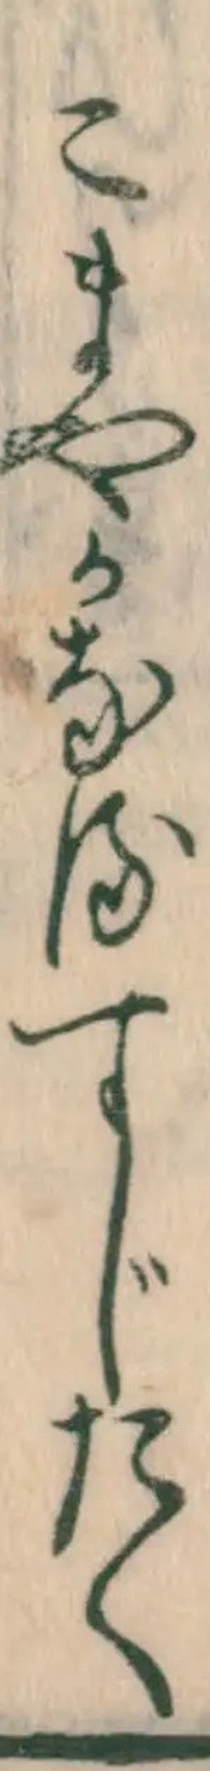こまやかなるすじたく
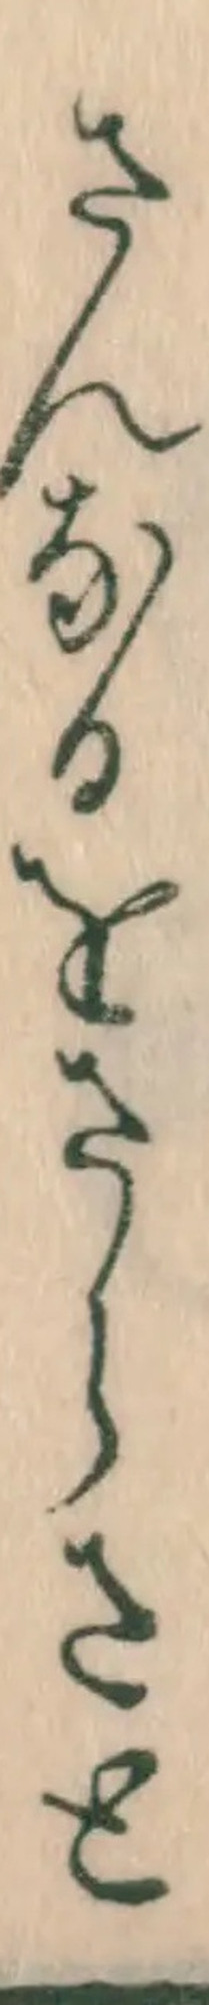さんなるをさらさと
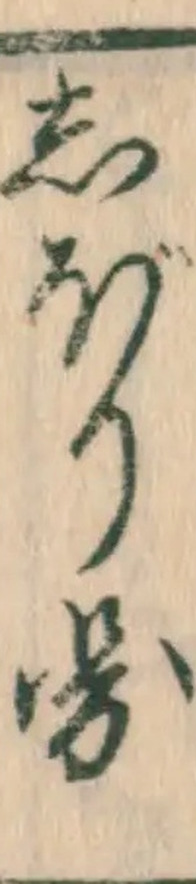しぼり図
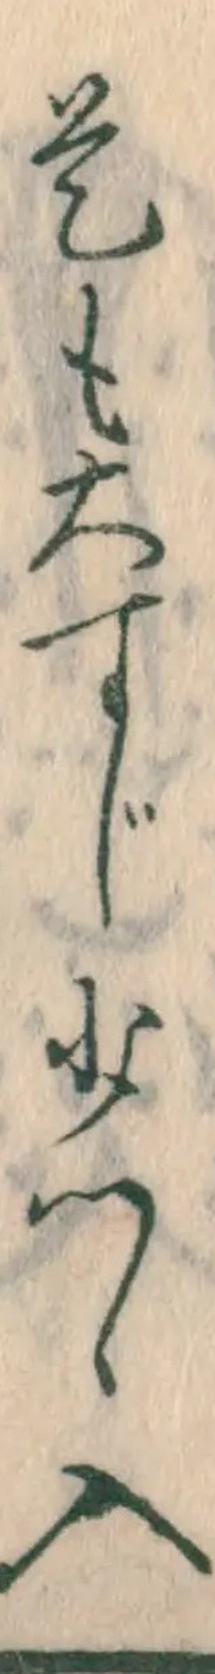是も大すじ少つゝ入
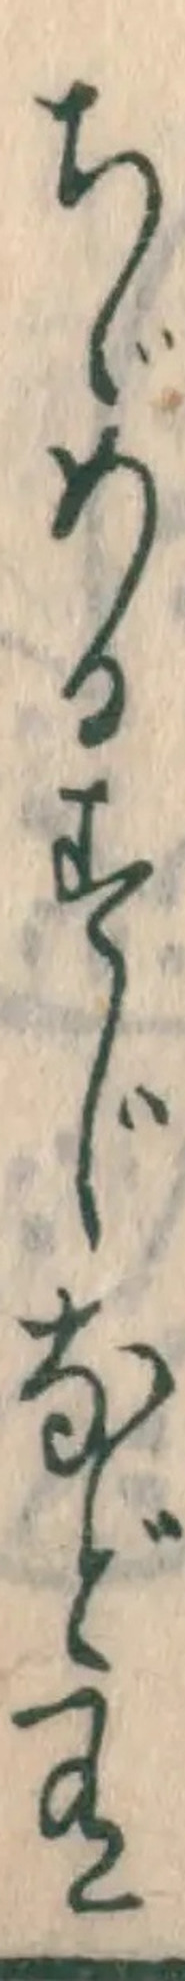ちゞめるすじなど有
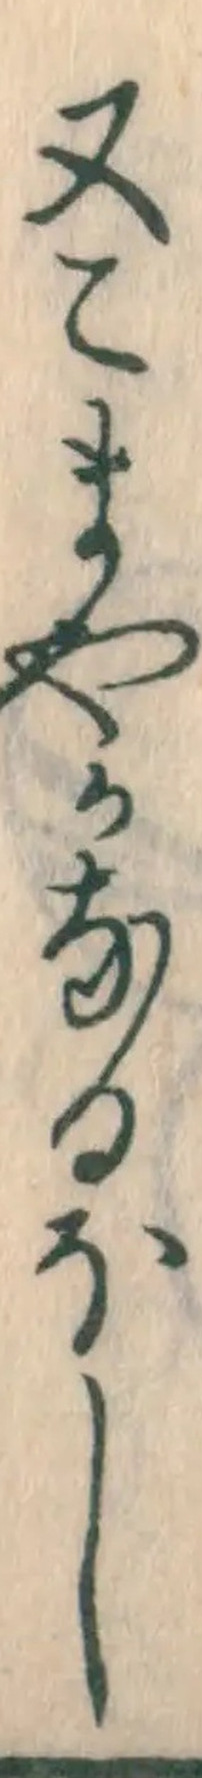又こまやかなるほし
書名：錦繍枕 5巻. [1]
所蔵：国立国会図書館 National Diet Library, JAPAN
